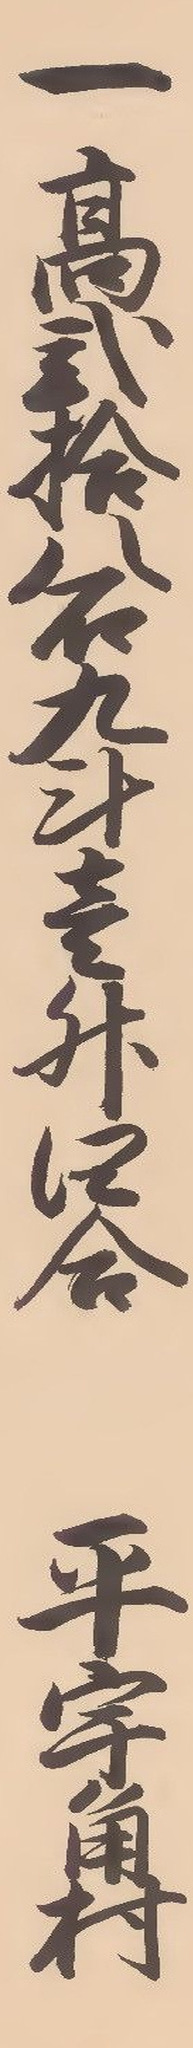一高弐拾八石九斗壱升四合平宇角村
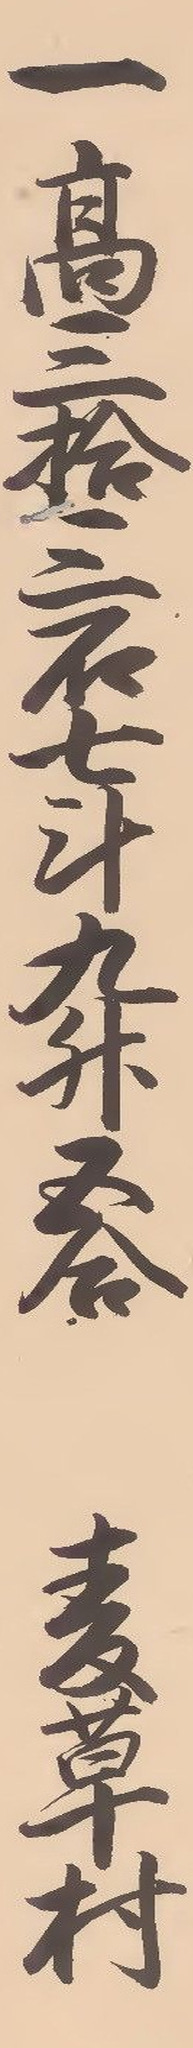一高三拾三石七斗九升五合麦草村

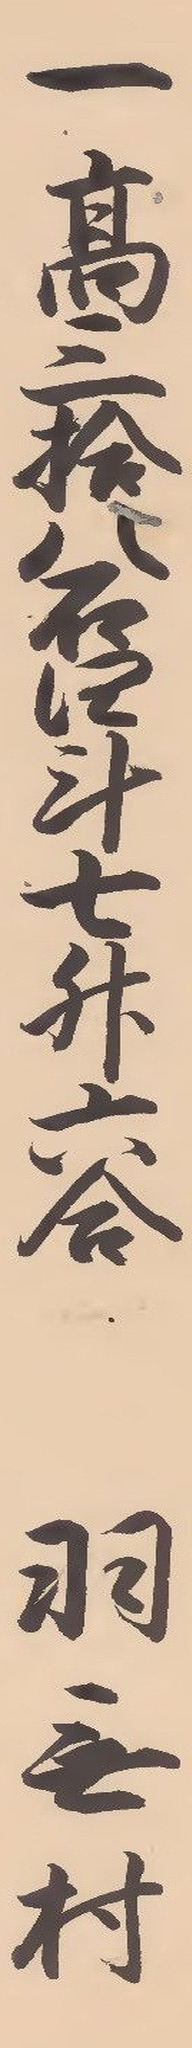一高三拾八石四斗七升六合羽無村
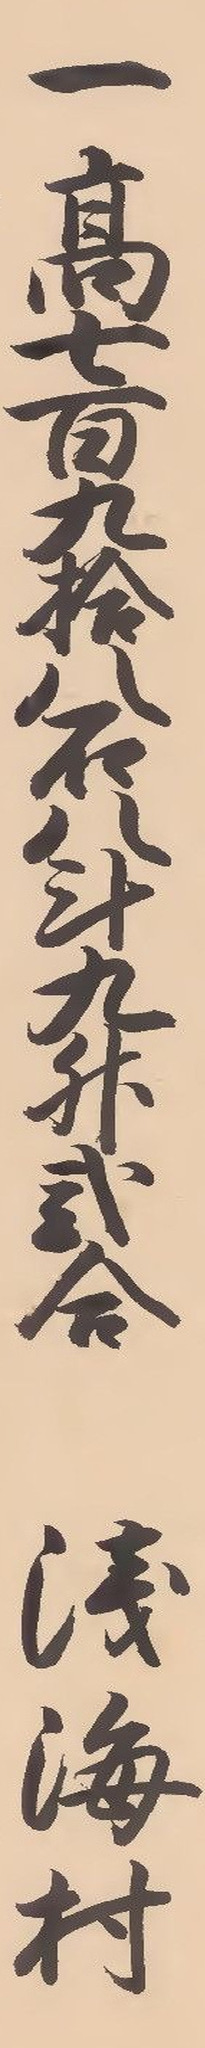一高七百九拾八石八斗九升弐合浅海村
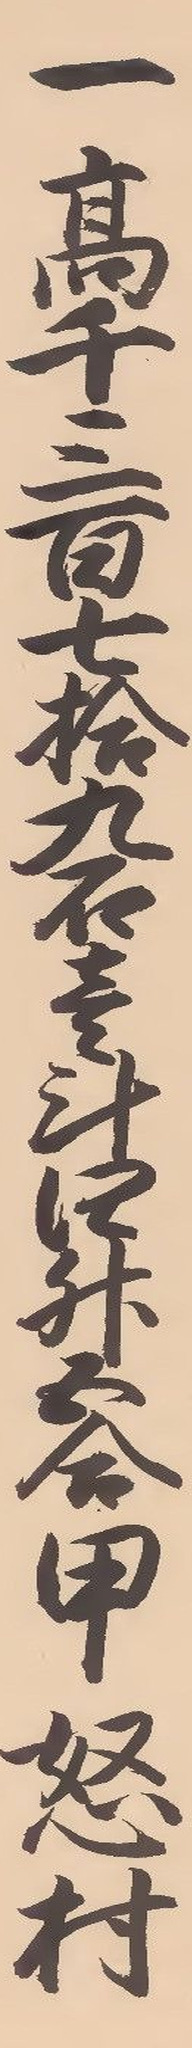一高千三百七拾九石壱斗四升五合甲怒村
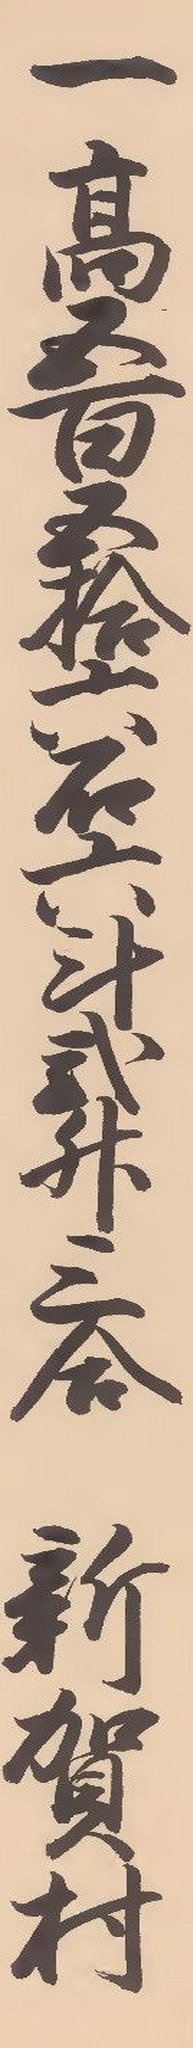一高五百五拾六石六斗弐升三合新賀村
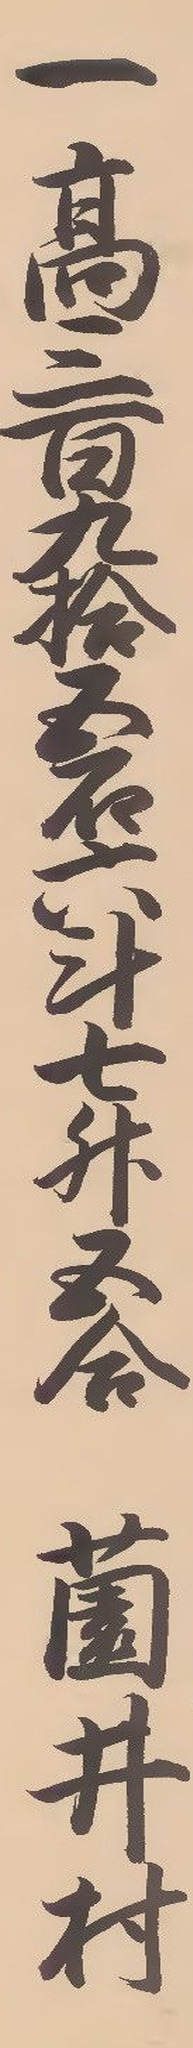一高三百九拾五石六斗七升五合園井村
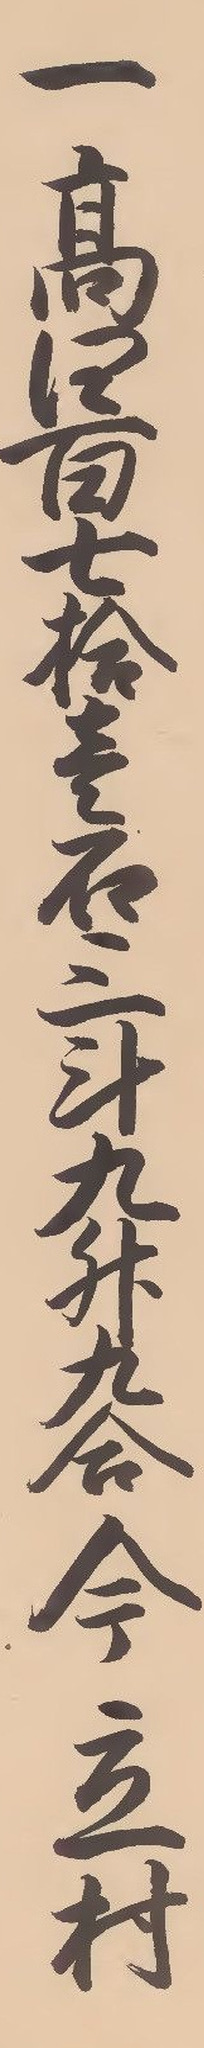一高四百七拾壱石三斗九升九合今立村
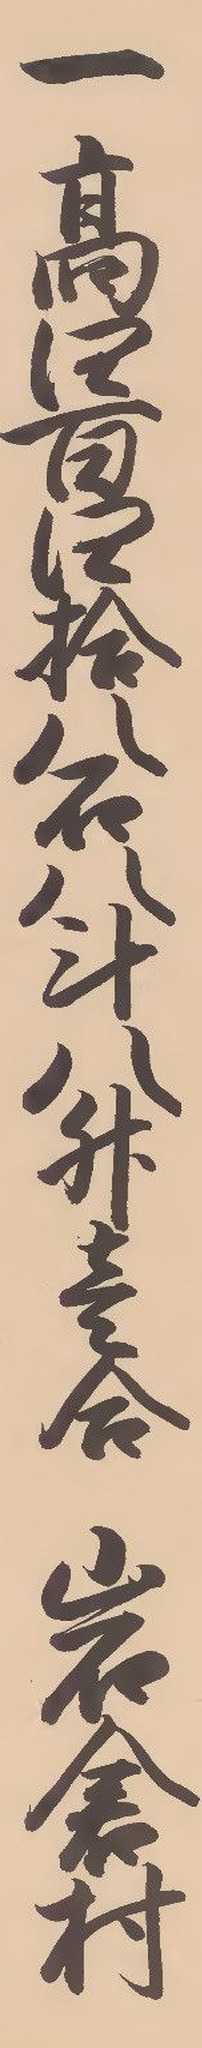一高四百四拾八石八斗八升壱合岩倉村
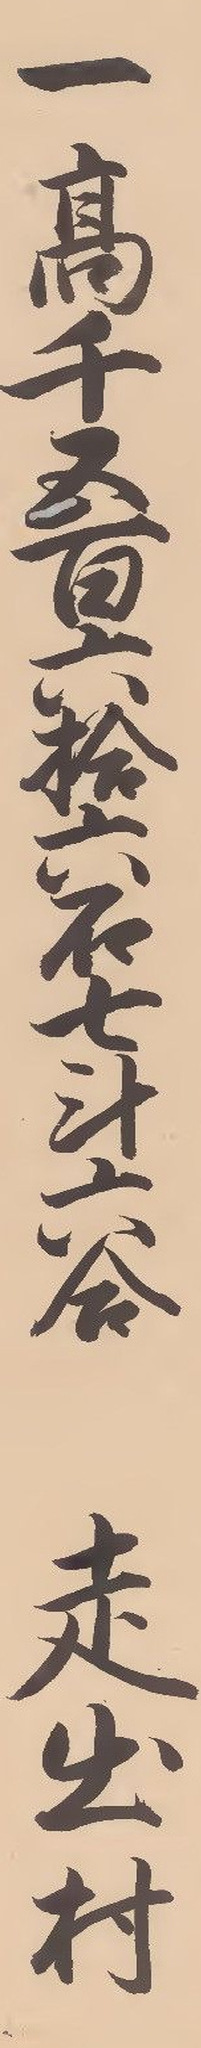一高千五百六拾六石七斗六合走出村

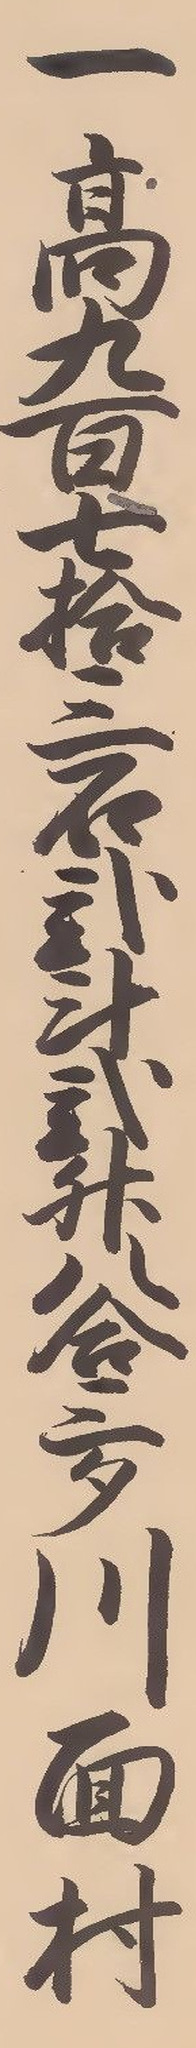一高九百七拾三石弐斗弐升八合三勺川面村
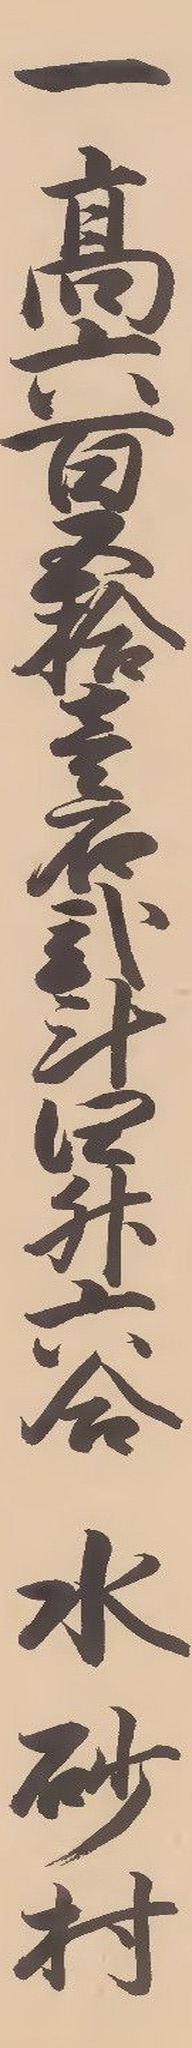一高六百五拾壱石弐斗四升六合水砂村
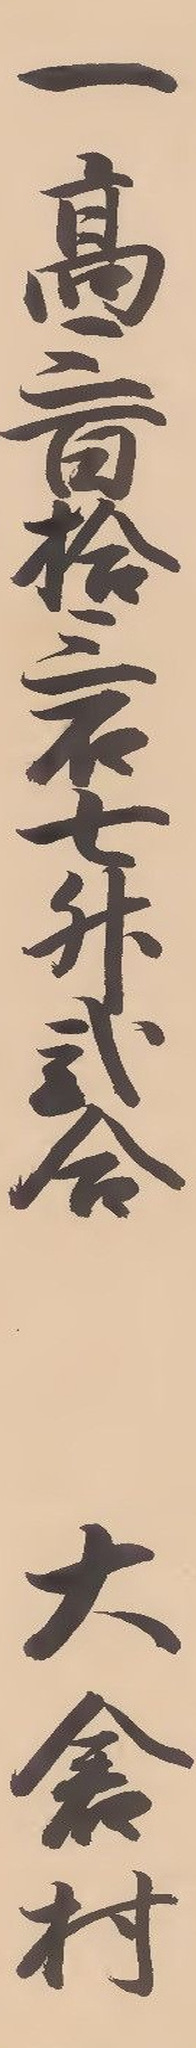一高三百拾三石七升弐合大倉村
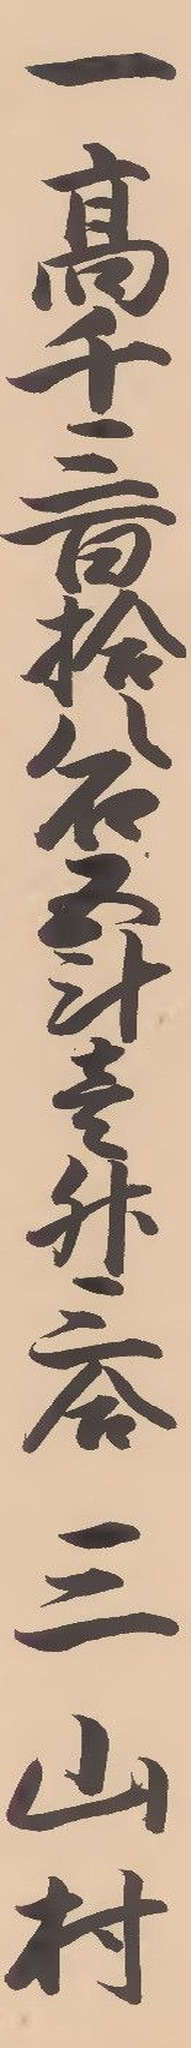一高千三百拾八石五斗壱升三合三山村
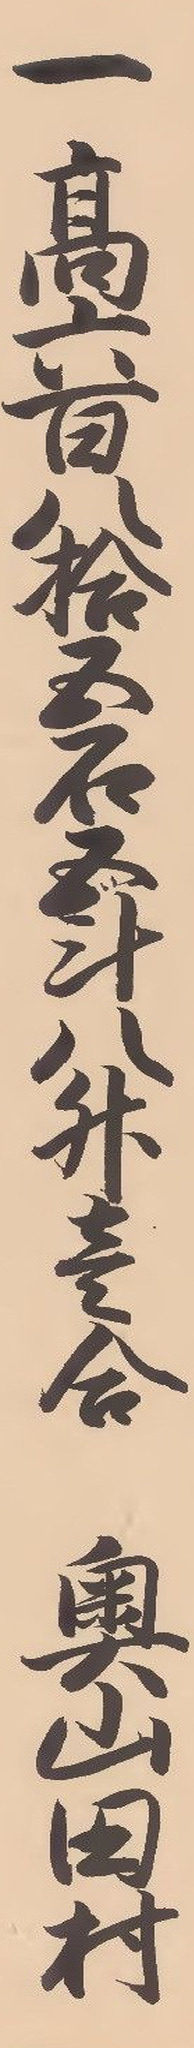一高六百八拾五石五斗八升壱合奥山田村
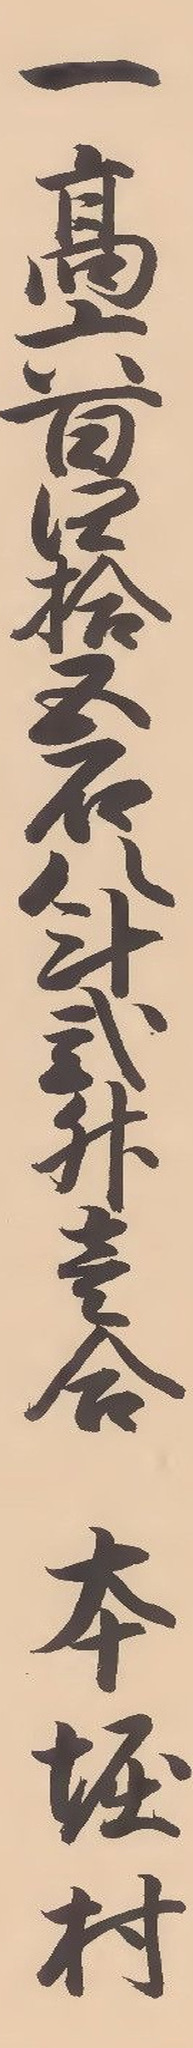一高六百四拾五石八斗弐升壱合本堀村
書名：備中国郷帳
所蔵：国立公文書館 National Archives of Japan
